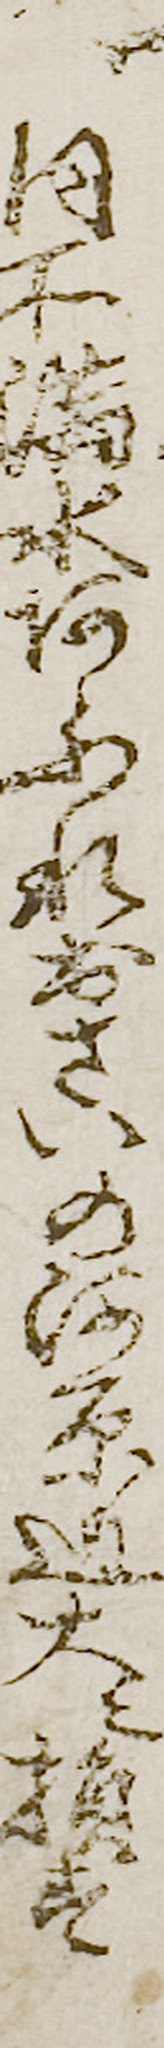同所満水あふれ出さいの河原辺大に損す
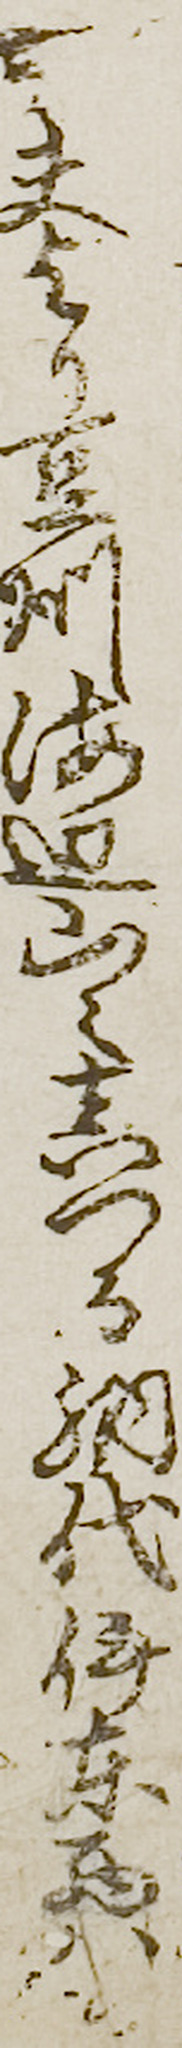夫より豆州海辺山々真つる網代伊東西は
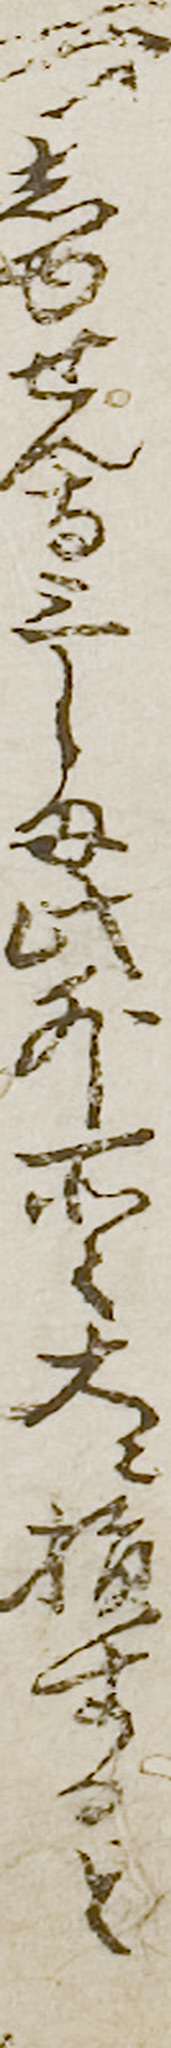しゆせん寺三しま此外所々大に損すると
